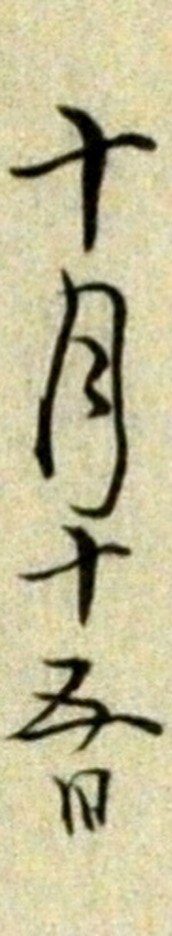十月十五日
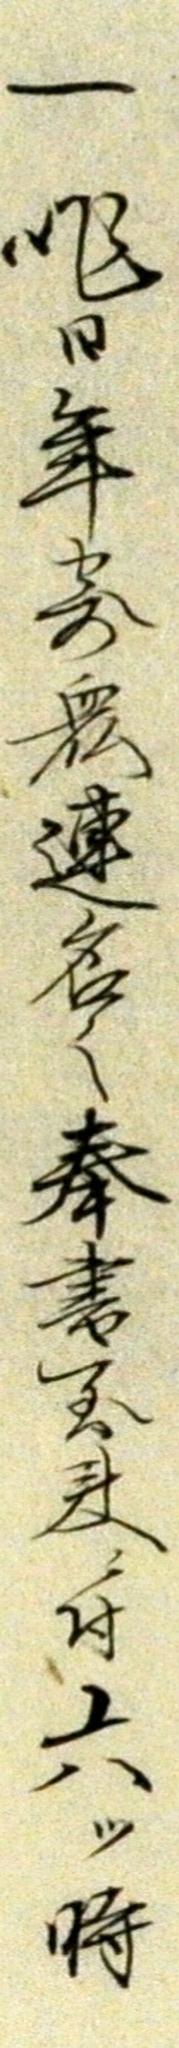一昨日、年寄衆連名之奉書到来ニ付、六ツ時
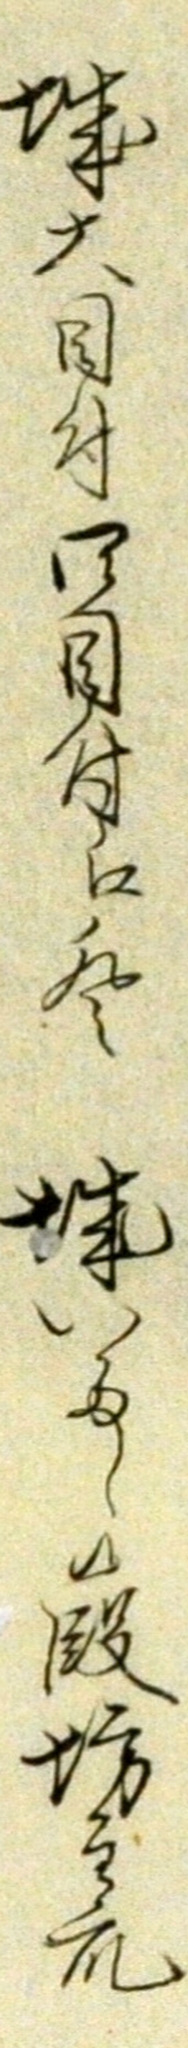城、大目付御目付江登城いたし候、殿坊主衆
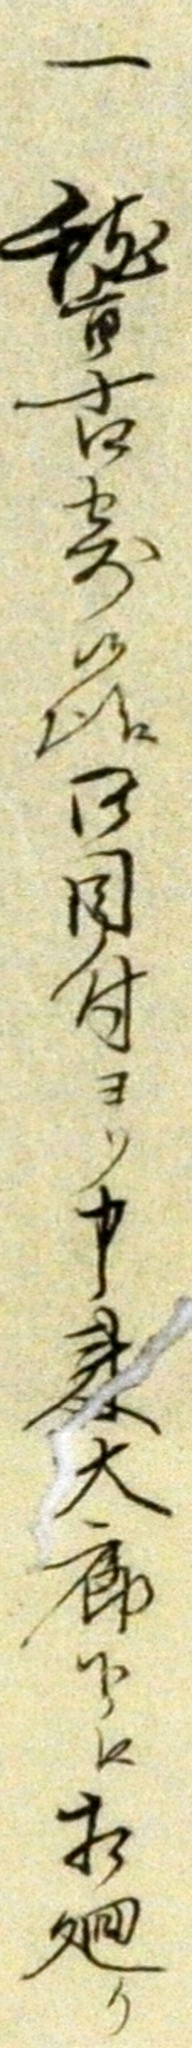一稽古寄候様、御目付ヨリ申来、大廊下江相廻り
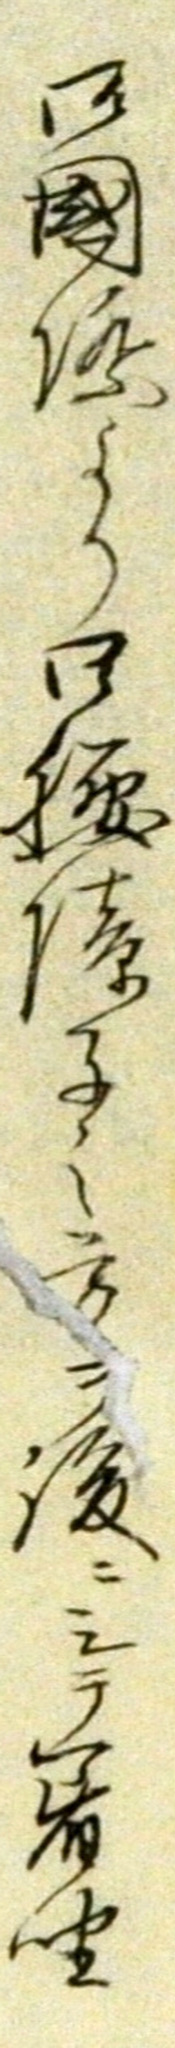御國際より御腰障子之方ニ後ニシテ着坐
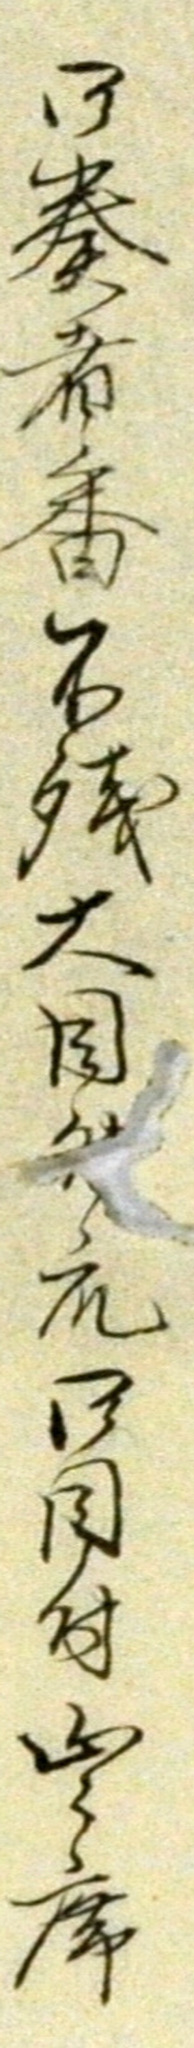御奏者番不残大目付衆御目付出席
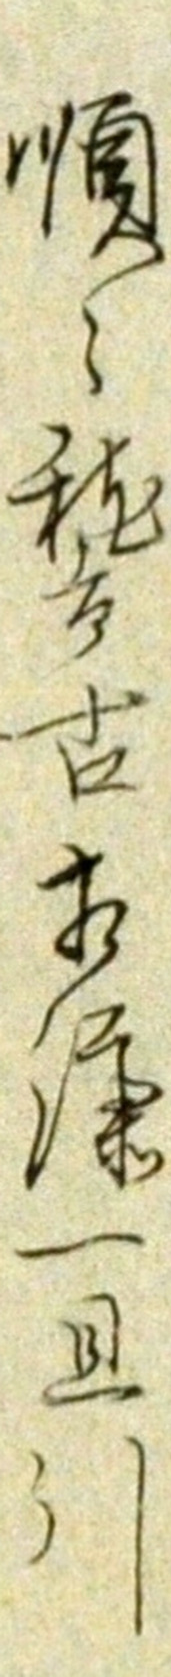順々稽古相済一旦引
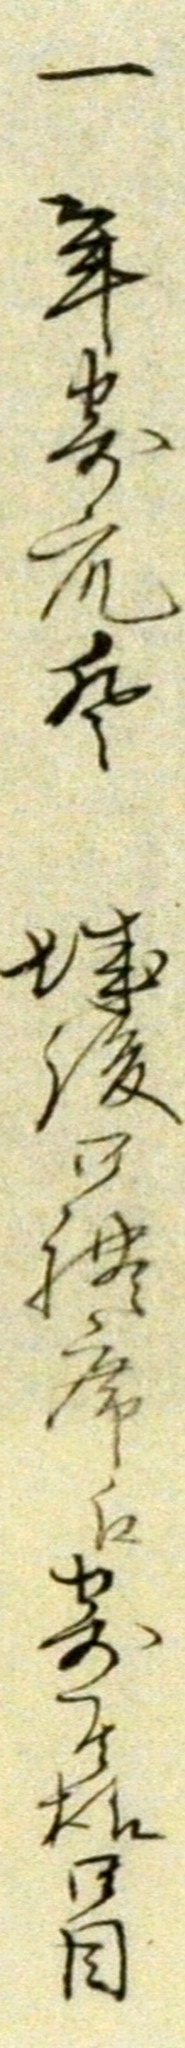一年寄衆登城後御礼席江寄付様御目
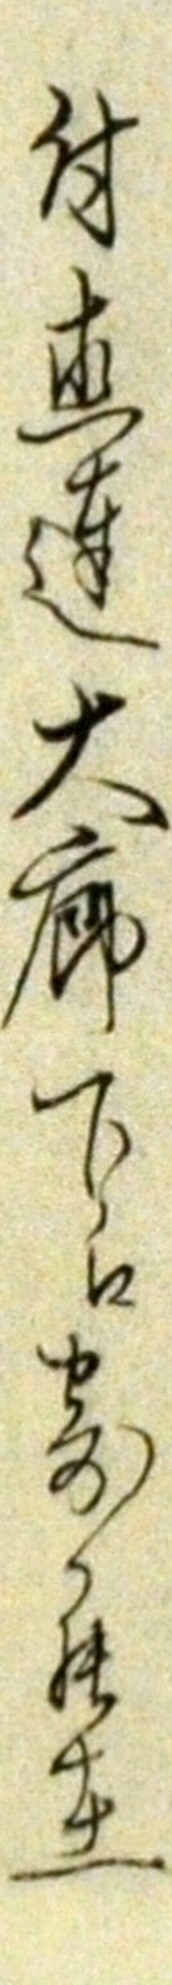付直達大廊下江寄罷在
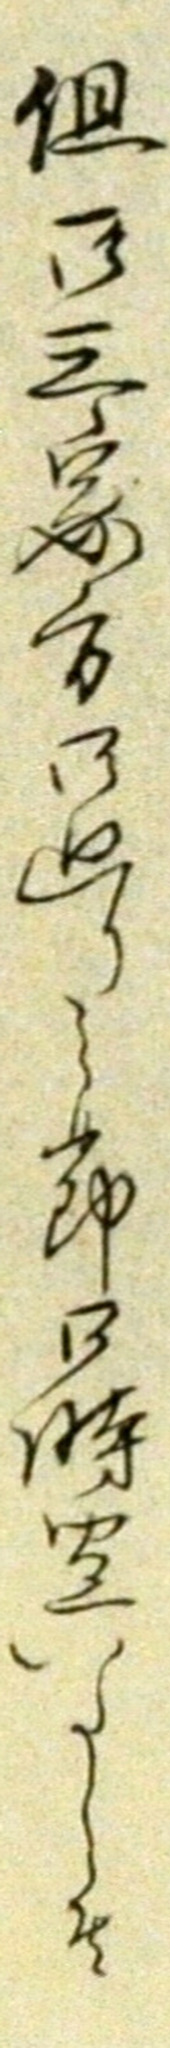但、御三家方御廻り之節、御時宜いたし候
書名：在所ヘ御暇ノ節ノ留外
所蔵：伊那市立高遠町図書館・合同会社AMANE
